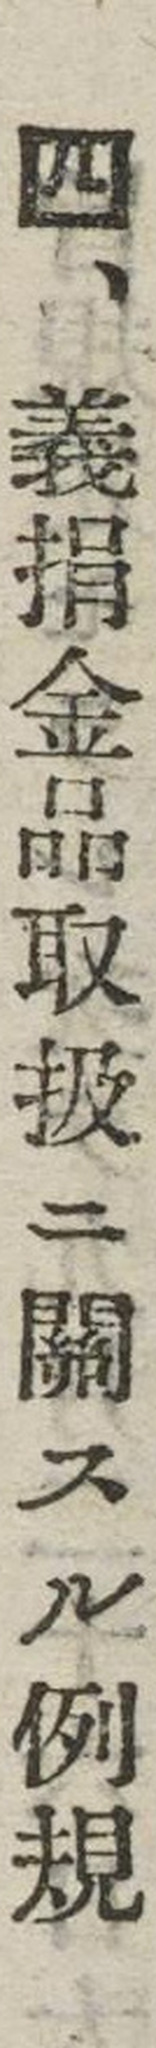四、義捐金品取扱ニ関スル例規
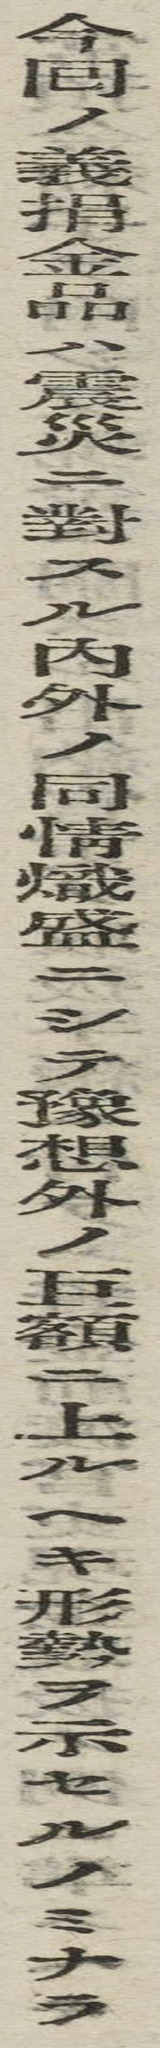今回ノ義捐金品ハ震災ニ対スル内外ノ同情熾盛ニシテ予想外ノ巨額ニ上ルヘキ形勢ヲ示セルノミナラ
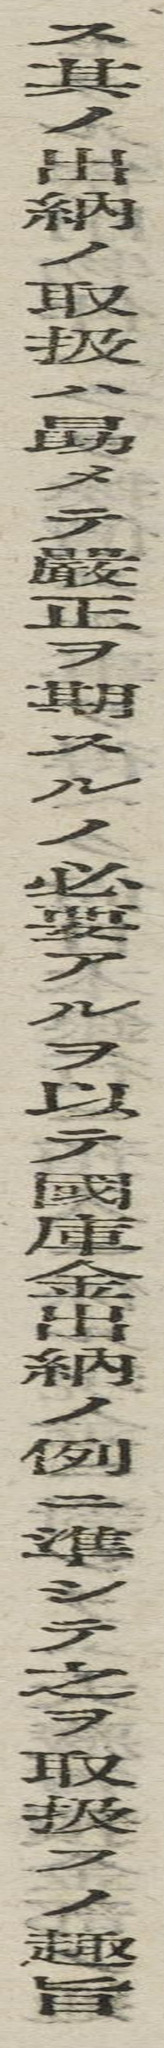ス其ノ出納ノ取扱ハ勗メテ厳正ヲ期スルノ必要アルヲ以テ国庫金出納ノ例ニ準シテ之ヲ取扱フノ趣旨
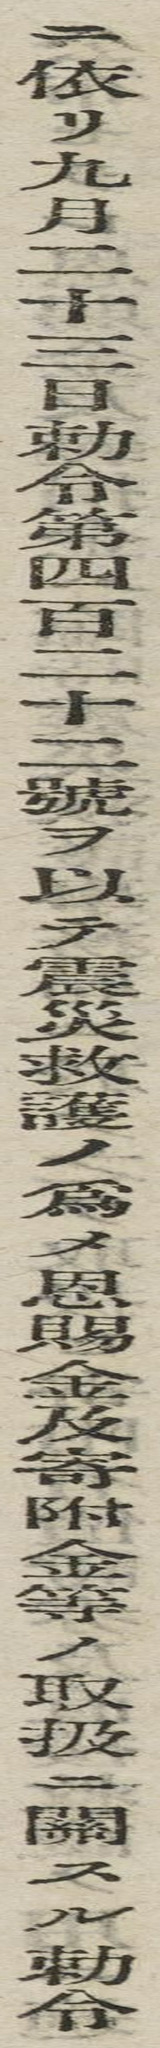ニ依リ九月二十三日勅令第四百二十二号ヲ以テ震災救護ノ為メ恩賜金及寄附金等ノ取扱ニ関スル勅令

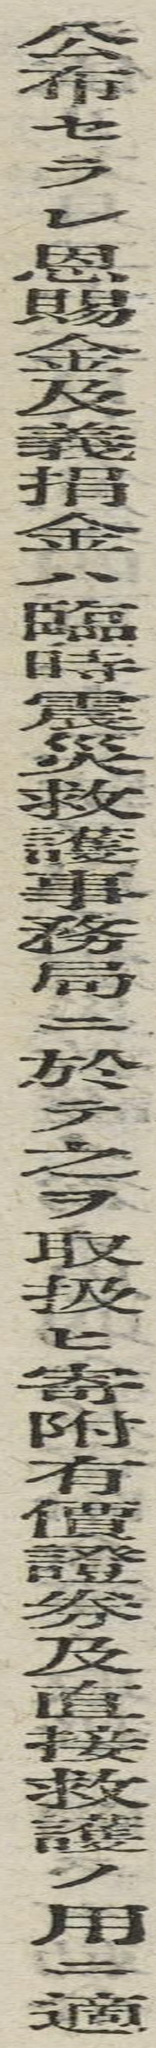公布セラレ恩賜金及義捐金ハ臨時震災救護事務局ニ於テ之ヲ取扱ヒ寄附有価証券及直接救護ノ用ニ適
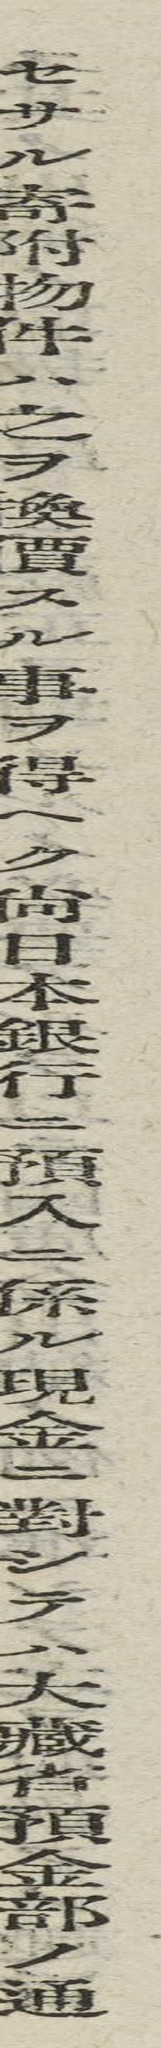セサル寄附物件ハ之ヲ換価スル事ヲ得ヘク尚日本銀行ニ預入ニ係ル現金ニ対シテハ大蔵省預金部ノ通
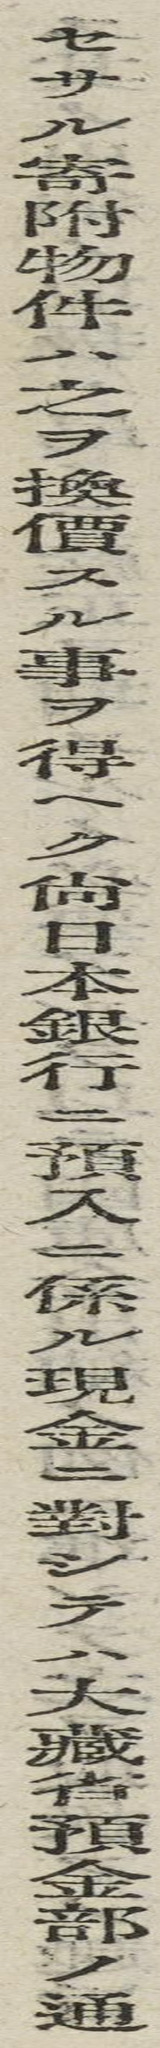セサル寄附物件ハ之ヲ換価スル事ヲ得ヘク尚日本銀行ニ預入ニ係ル現金ニ対シテハ大蔵省預金部ノ通
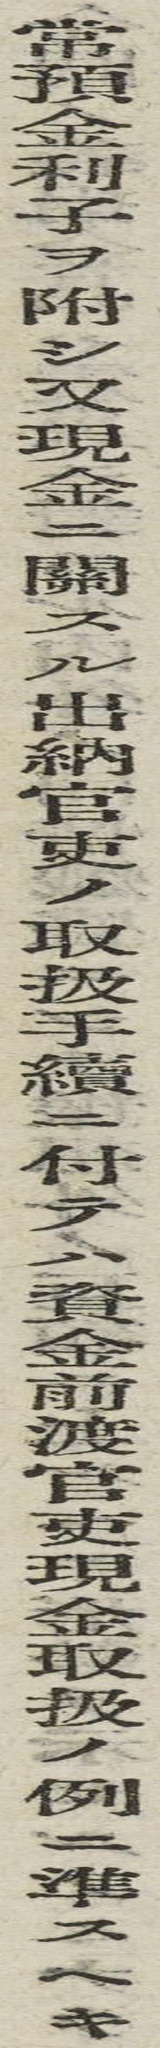常預金利子ヲ附シ又現金ニ関スル出納官吏ノ取扱手続ニ付テハ資金前渡官吏現金取扱ノ例ニ準スヘキ
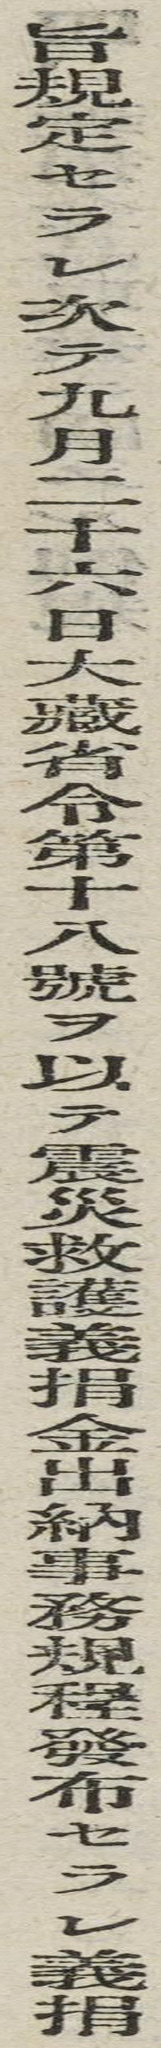旨規定セラレ次テ九月二十六日大蔵省令第十八号ヲ以テ震災救護義捐金出納事務規程発布セラレ義捐
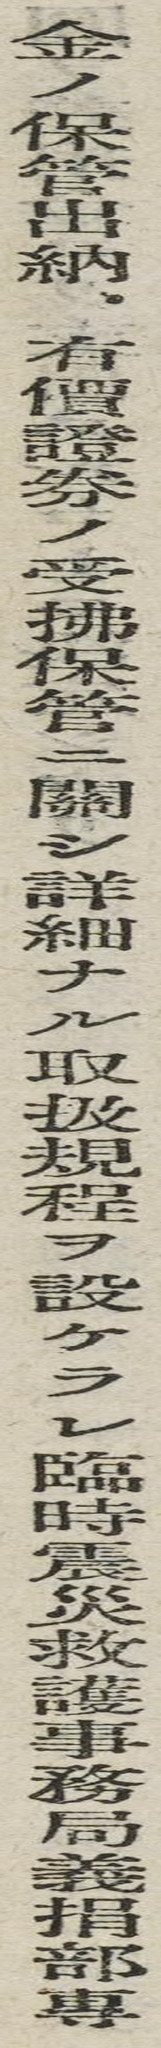金ノ保管出納、有価証券ノ受払保管ニ関シ詳細ナル取扱規程ヲ設ケラレ臨時震災救護事務局義捐部専
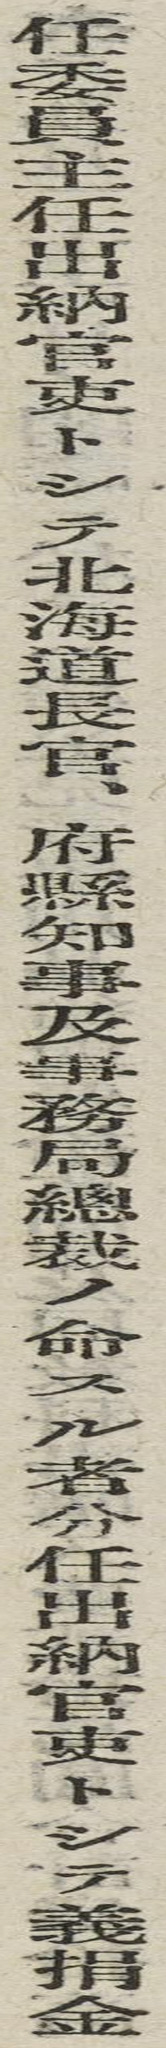任委員主任出納官吏トシテ北海道長官、府県知事及事務局総裁ノ命スル者分任出納官吏トシテ義捐金
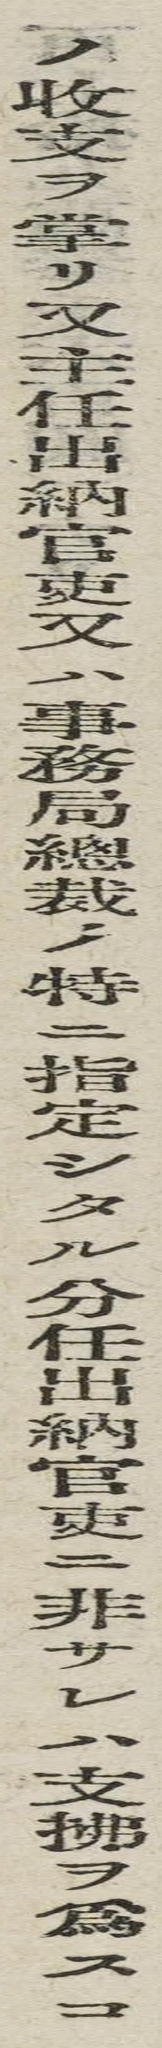ノ収支ヲ掌リ又主任出納官吏又ハ事務局総裁ノ特ニ指定シタル分任出納官吏ニ非サレハ支払ヲ為スコ
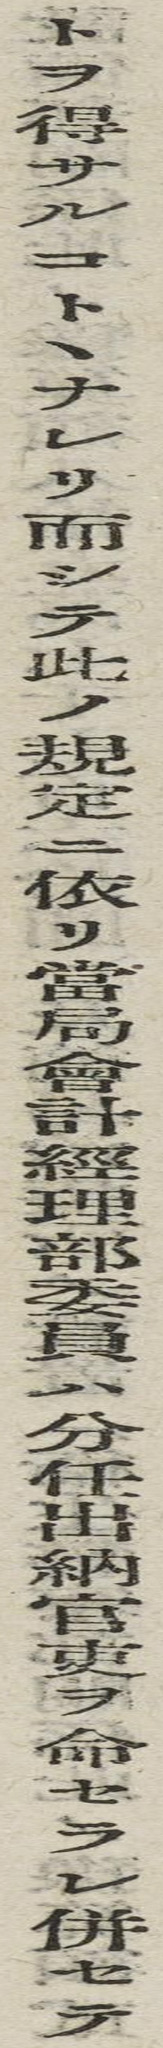トヲ得サルコトヽナレリ而シテ此ノ規定ニ依リ当局会計経理部委員ハ分任出納官吏ヲ命セラレ併セテ
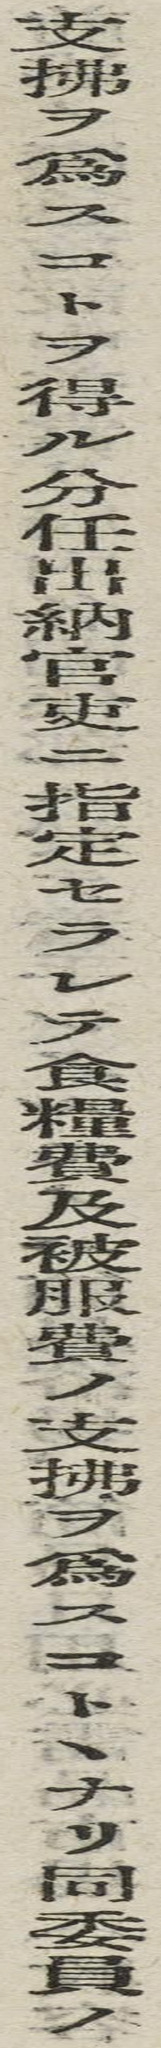支払ヲ為スコトヲ得ル分任出納官吏ニ指定セラレテ食糧費及被服費ノ支払ヲ為スコトヽナリ同委員ノ
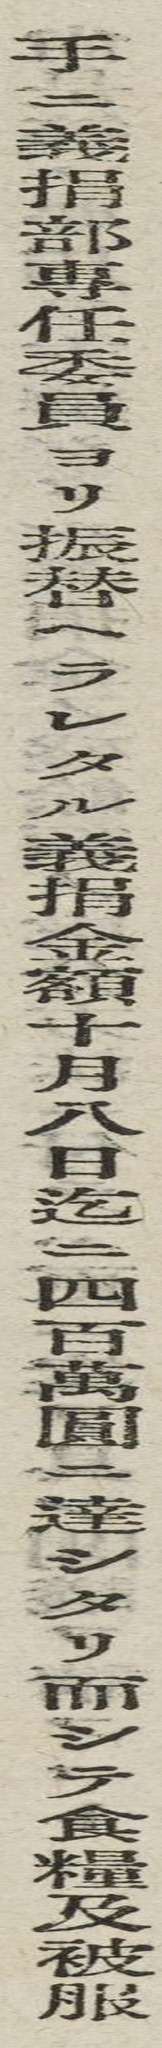手ニ義捐部専任委員ヨリ振替ヘラレタル義捐金額十月八日迄ニ四百万円ニ達シタリ而シテ食糧及被服
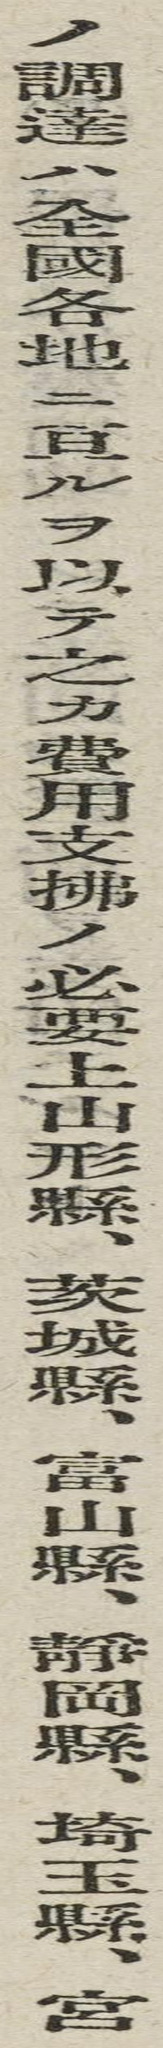ノ調達ハ全国各地ニ亘ルヲ以テ之カ費用支払ノ必要上山形県、茨城県、富山県、静岡県、埼玉県、宮
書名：震災被害状況並救護施設概要
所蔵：東京大学地震研究所図書室 Earthquake Research Institute Library, The University of Tokyo, JAPAN
